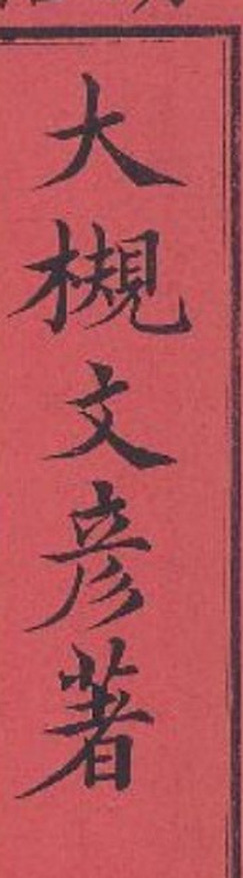大槻文彦著
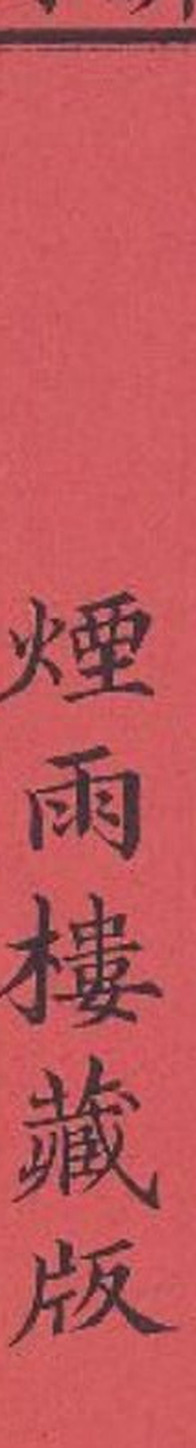煙雨楼蔵版
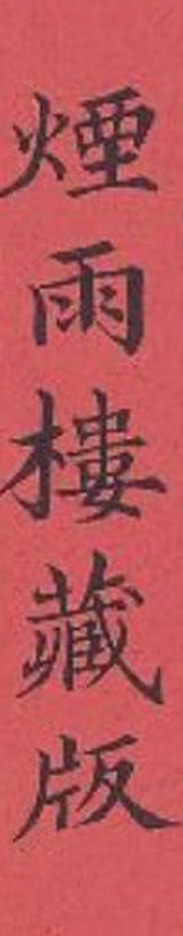煙雨楼蔵版
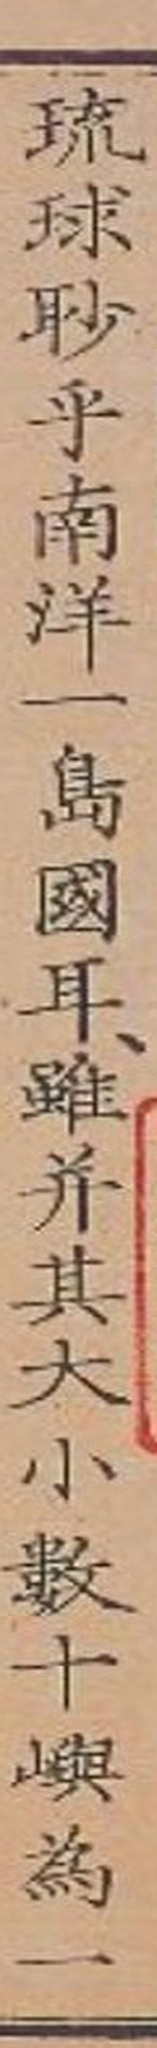琉球眇乎南洋一島国耳、雖幷其大小数十嶼為一
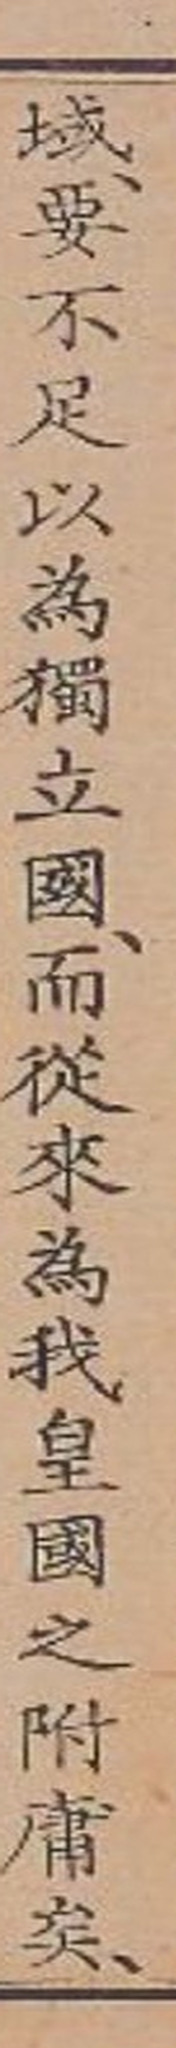域、要不足以為独立国、而従来為我皇国之附庸矣、
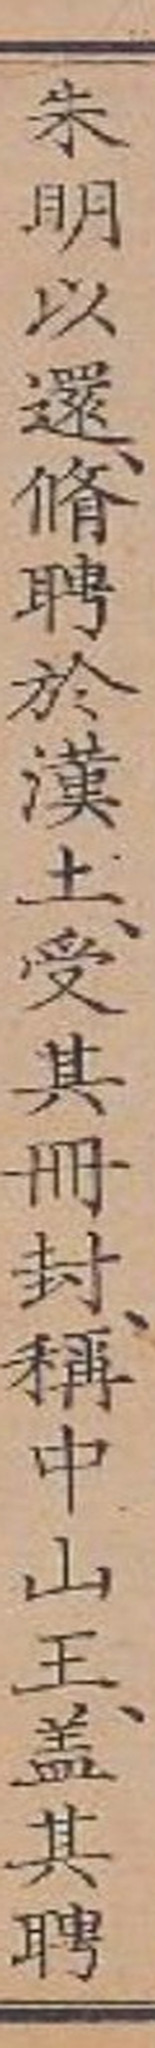朱明以還、脩聘於漢土、受其冊封、称中山王、蓋其聘
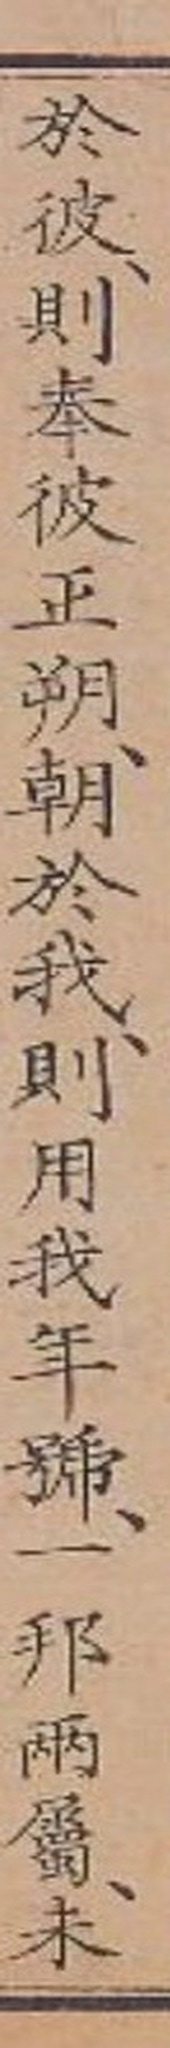於彼、則奉彼正朔、朝於我、則用我年号、一邦両属、未
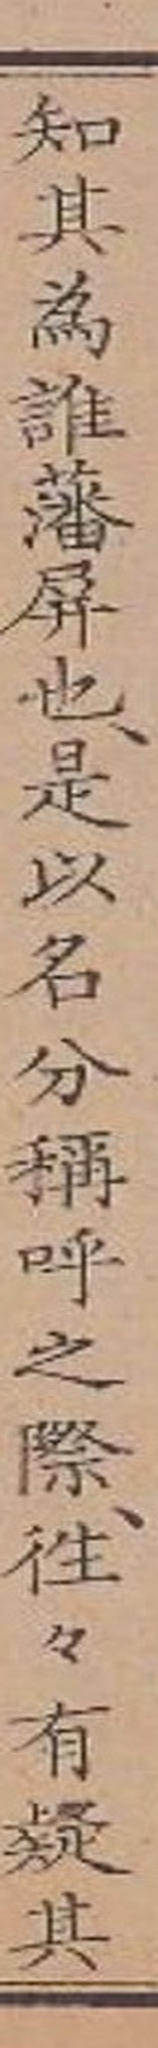知其為誰藩屛也、是以名分称呼之際、往々有疑其
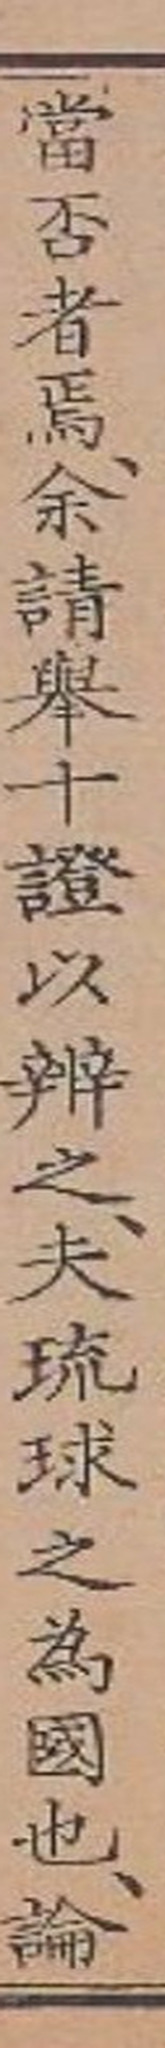当否者焉、余請挙十証以弁之、夫琉球之為国也、論
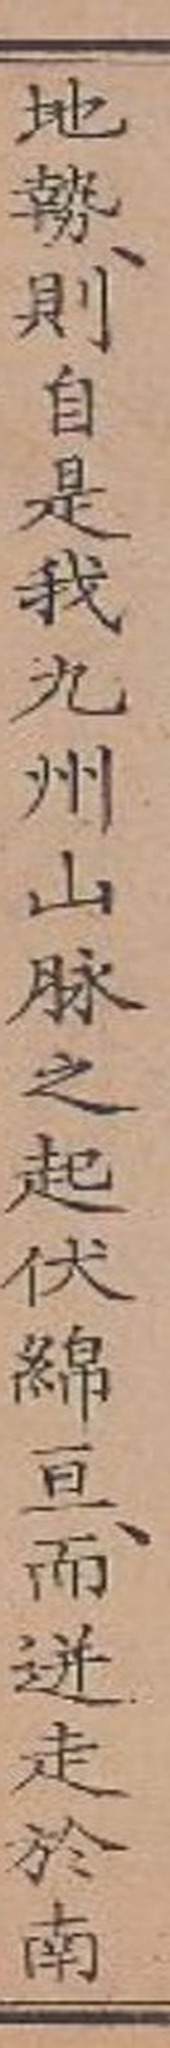地勢、則自是我九州山脈之起伏綿亘、而迸走於南
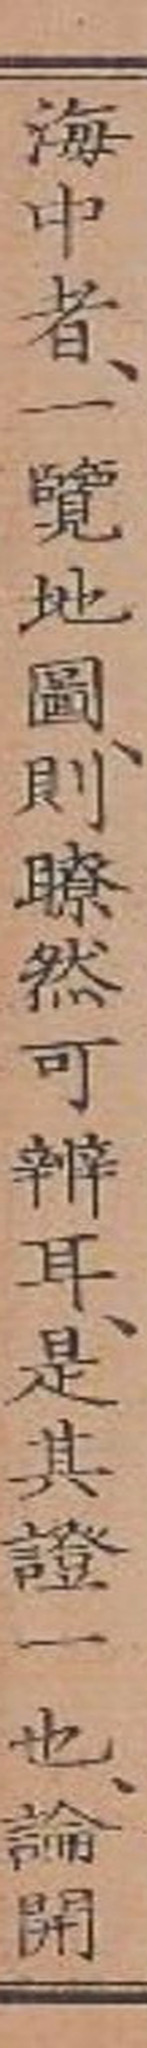海中者、一覧地図、則瞭然可弁耳、其証一也、論開

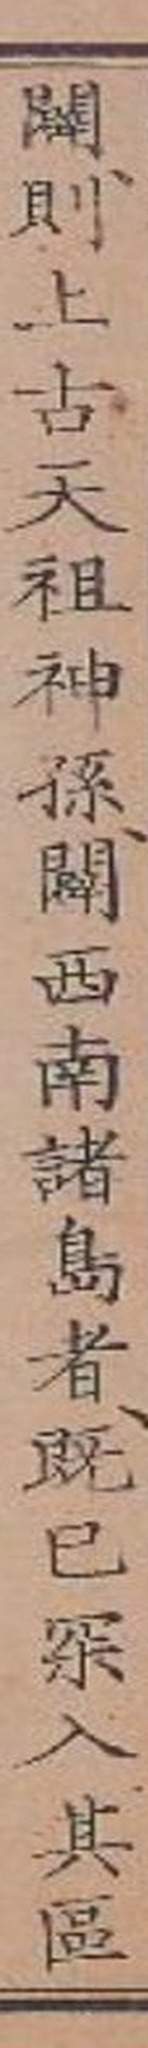闢、則上古天祖神孫、闢西南諸島者、既巳入其区
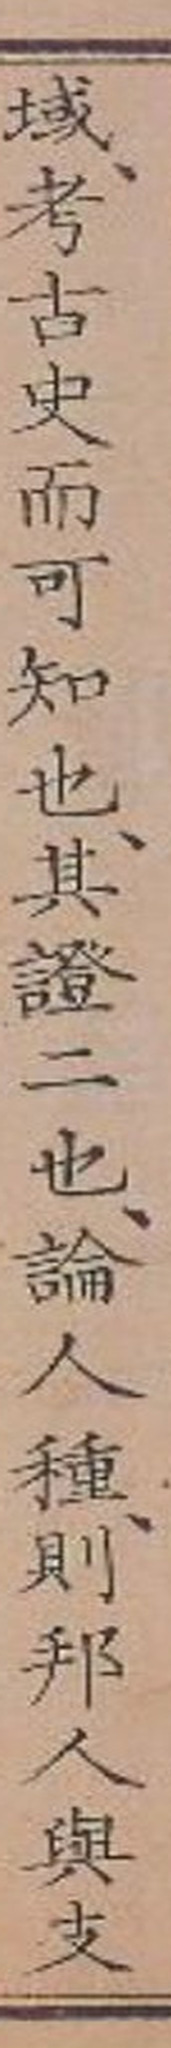域、考古史而可知也、其証二也、論人種、則邦人与支
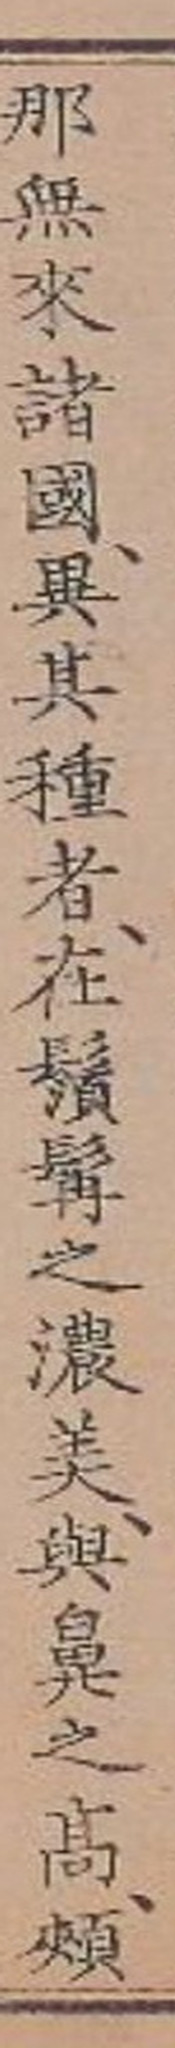那無来諸国、異其種者、在鬚髥之濃美、与鼻之高、頰
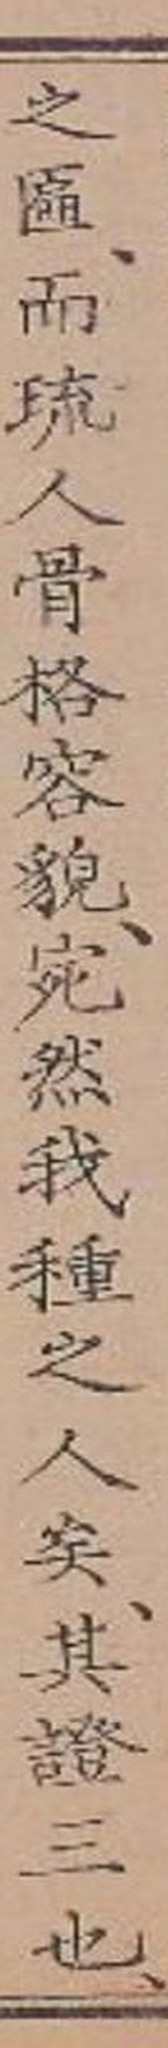之匾、而琉人骨格容貌、宛然我種之人矣、其証三也、
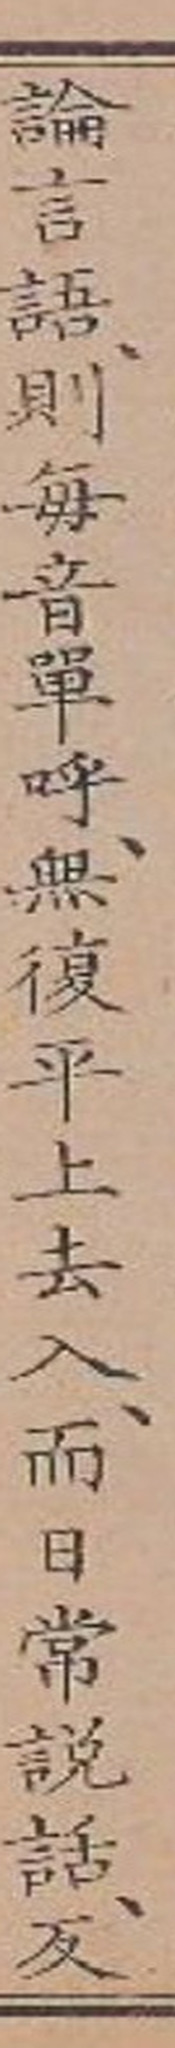論言語、則毎音単呼、無復平上去入、而日常説話、反
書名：琉球新誌 巻上
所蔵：University of the Ryukyus Library
